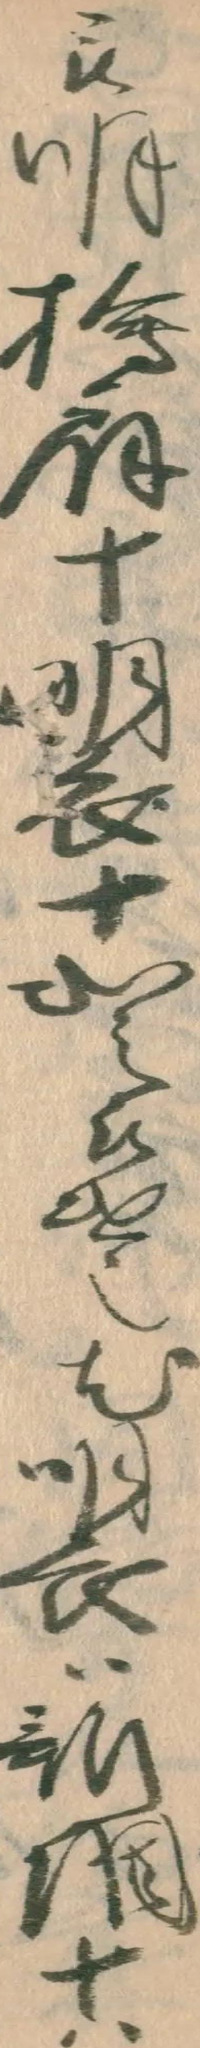被明檜扇十明衣十出之被遣也尤明衣ハ新調十ハ
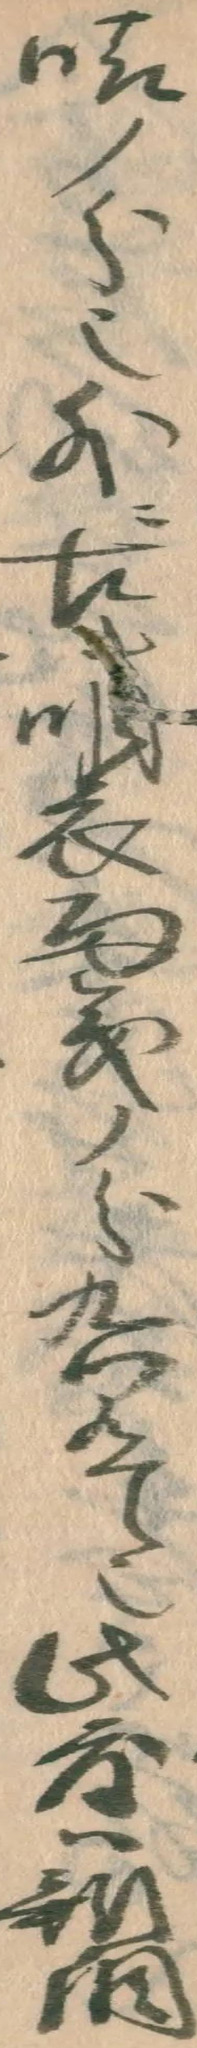晴ノ分也外ニ古キ明衣雨義ノ分九ツ有之也此度ハ新調
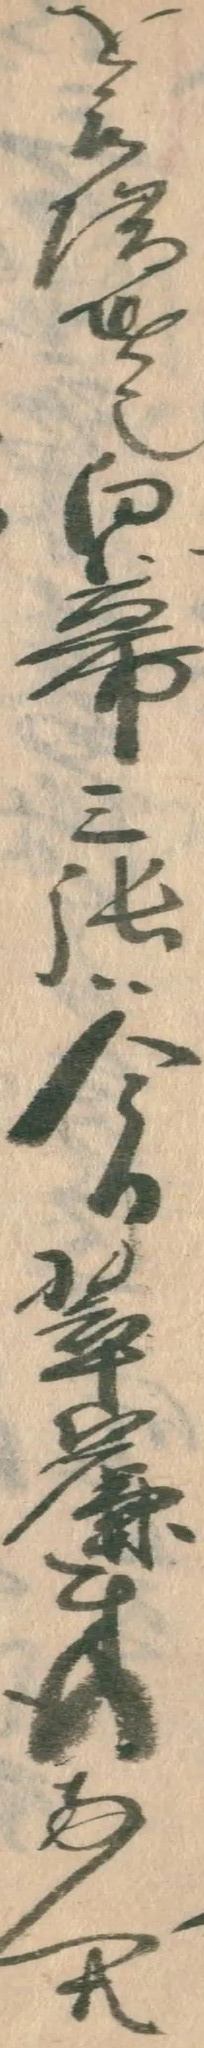を被借遣也白幕三張ハ今日翠簾奉行両人共
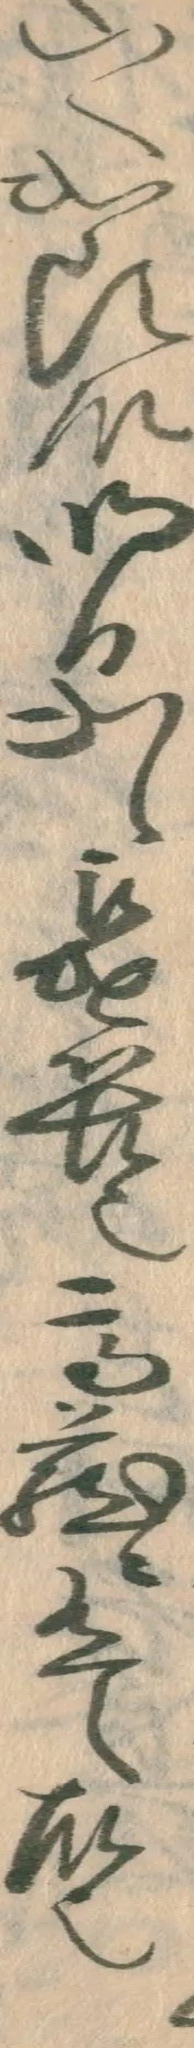山へ出頭故明日出し被遣筈也高蔵ニ有之故也
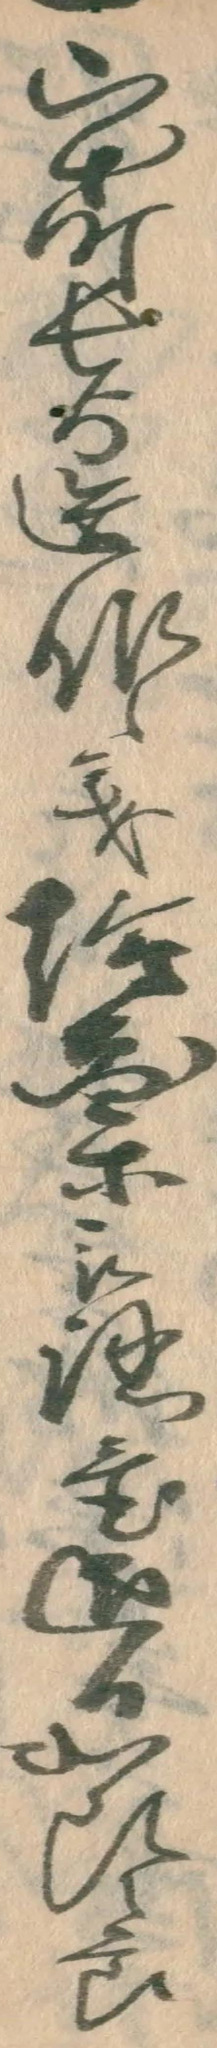一山本町長右衛門造作之義絵図等被認置追而出頭之節
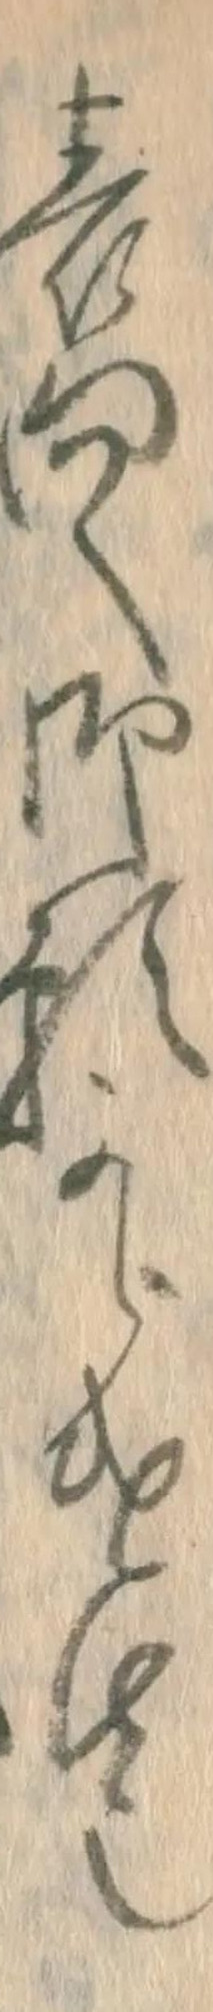表向へ御願可被遣由也
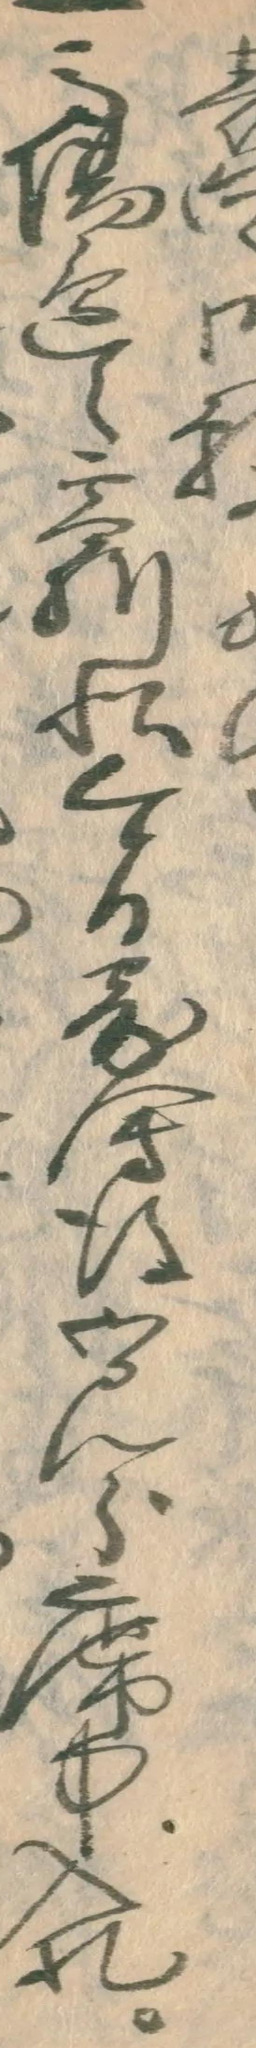一馬場辺之雪折松今日寄会後御見分席中入札
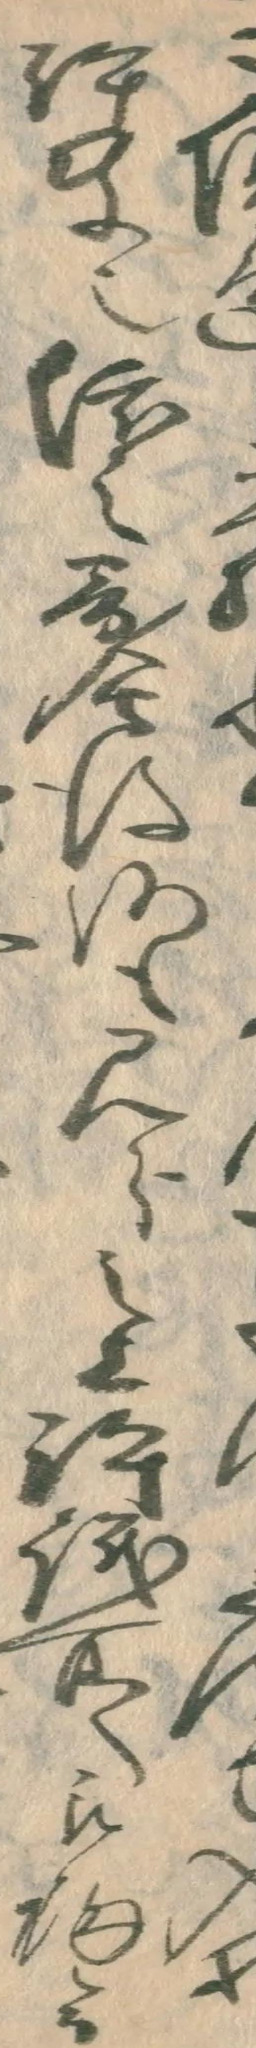評決也依之寄合後何も見分之上評議所へ被移候而
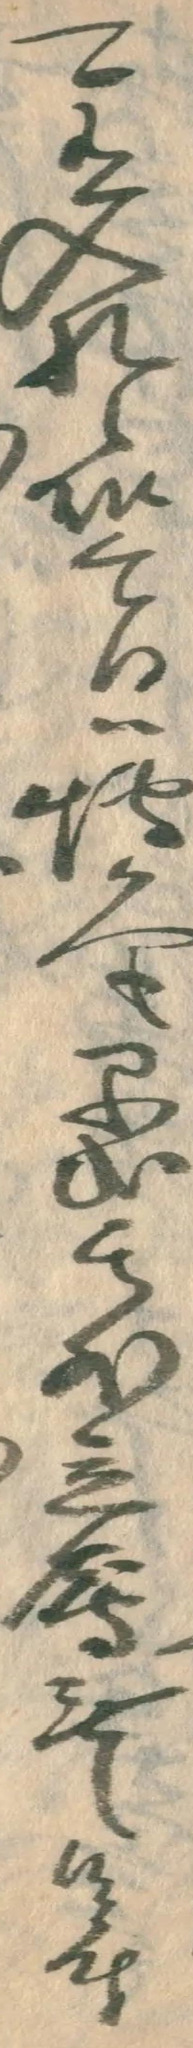可有入札候処今日ハ博久も早出其外立会無之候ニ付
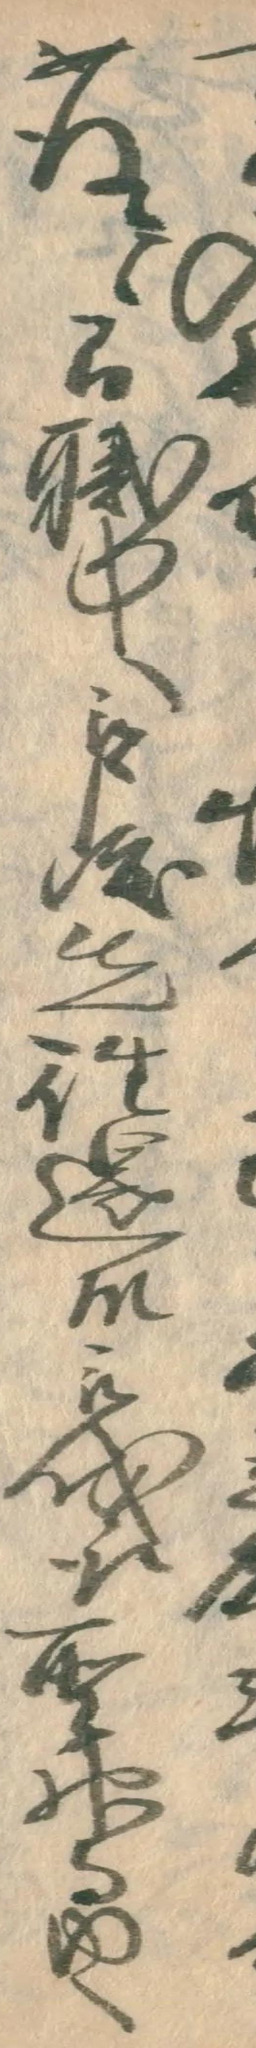如何ニ候間職中へ被申渡先往還故被伐取聖神寺内へ
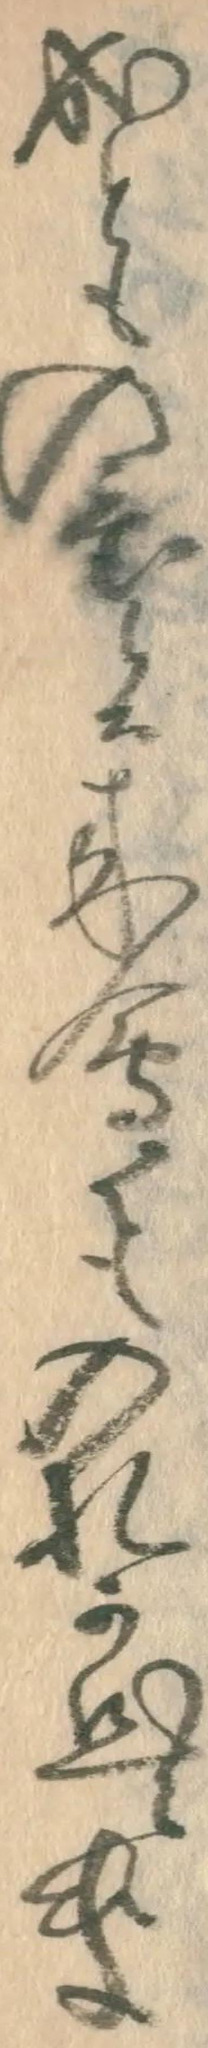成とも入置候而来会ニても入札可然ニ決

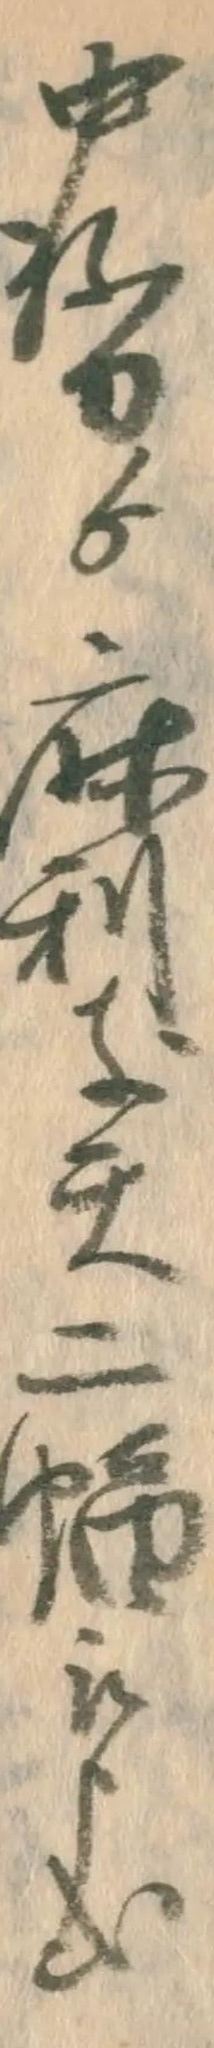中務ゟ麻利支天二幅被申出
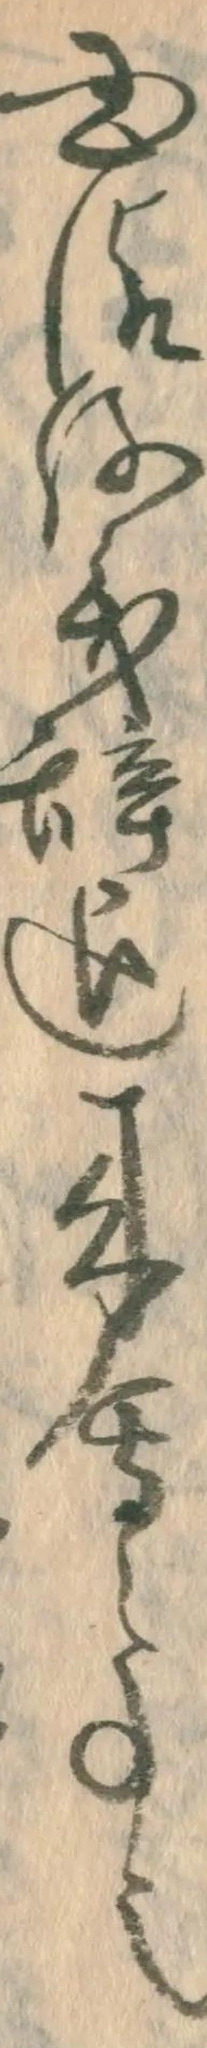国清役義辞退来会之事也
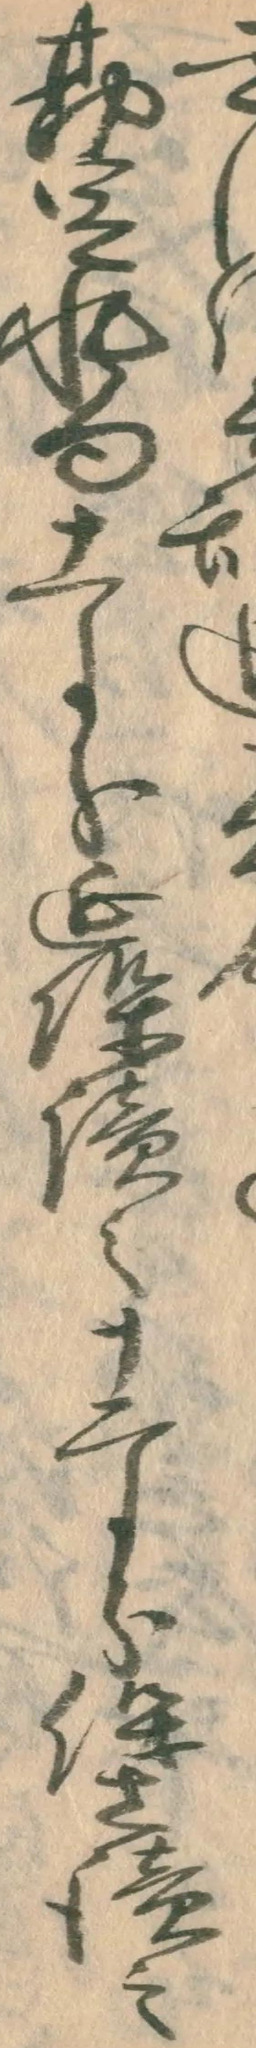勘定帳面十一月分延保読之十二月分保土読之
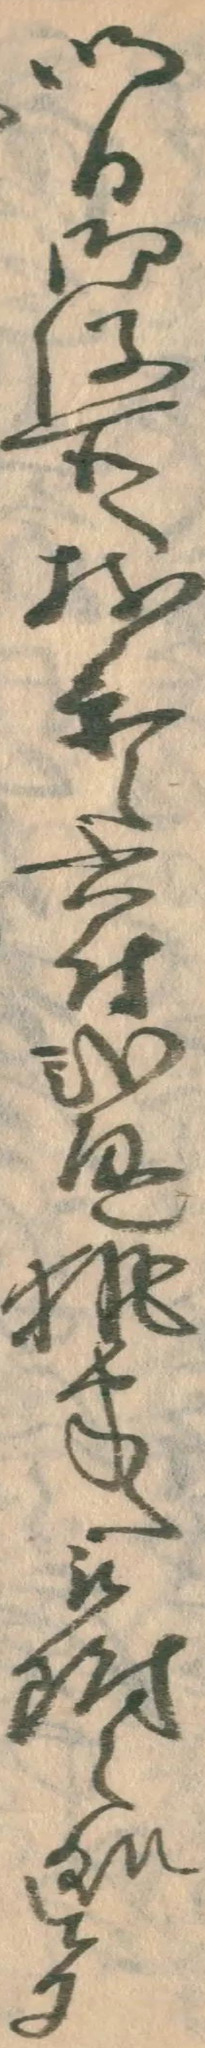一明日御役所へ持参之書付弐通執筆へ被附之処今夕
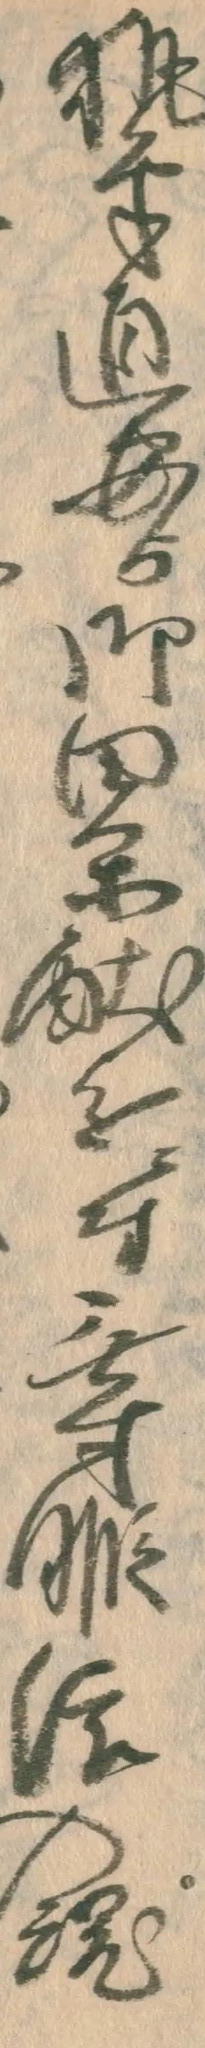執筆直安ゟ御田楽献進ニ付無寸暇依入魂
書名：賀茂社記録. 第60冊
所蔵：国立国会図書館 National Diet Library, JAPAN
